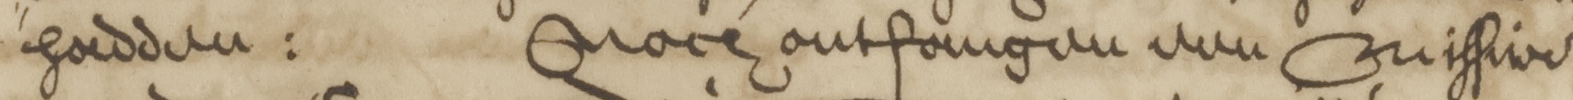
hadden: Noch ontfangen een Missive
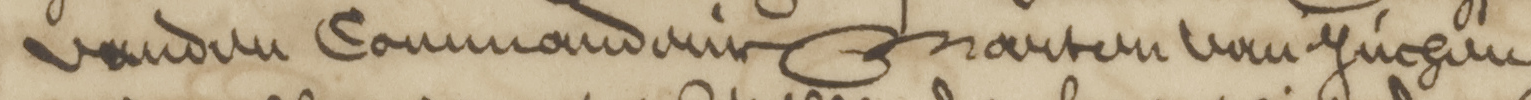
vanden Commandeur Marten van Juchen
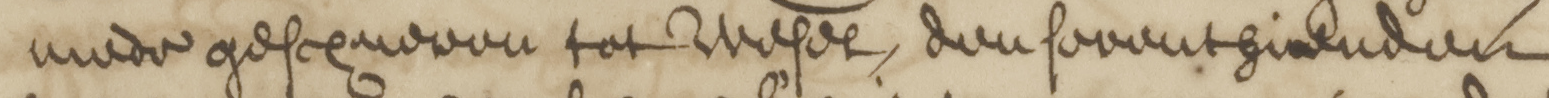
mede geschreven tot Wesel, den seventhienden
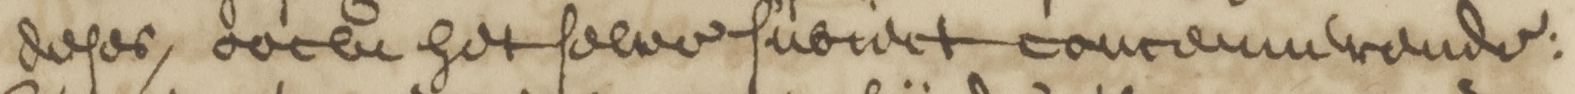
deses, oock het selve subiect concernerende:
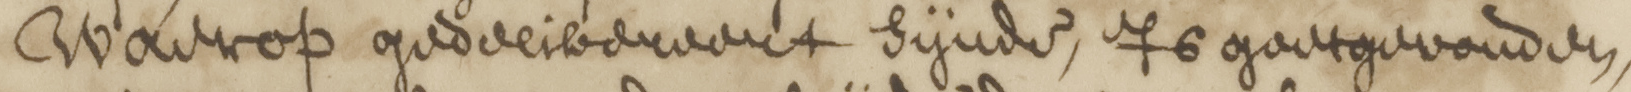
Waerop gedelibereert sijnde, Is goetgevonden
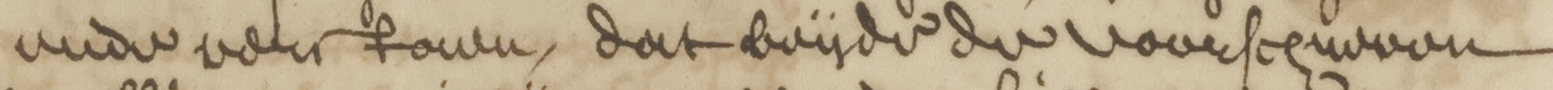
ende verstaen, dat beijde de voorschreven
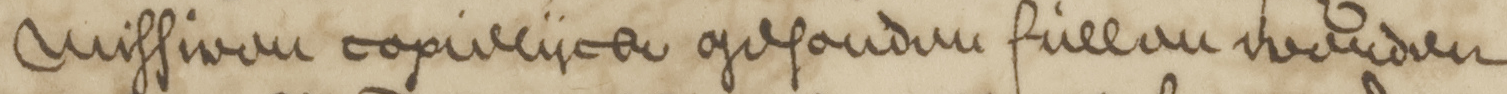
missiven copielijck gesonden sullen werden
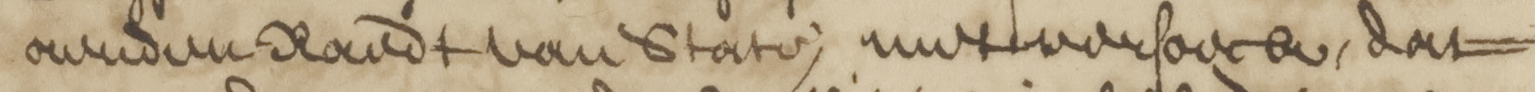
aenden Raedt van State; met versoeck, dat
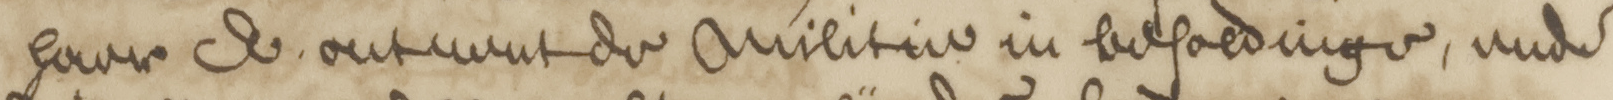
haer E. ontrent de militie in besoldinge, ende
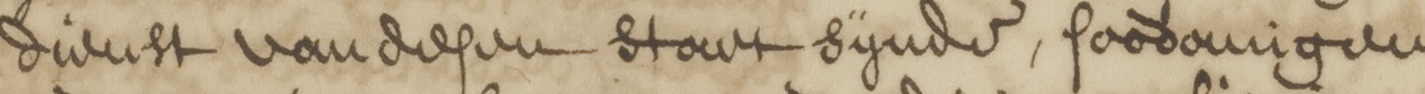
dienst van desen Staet sijnde, soodanigen
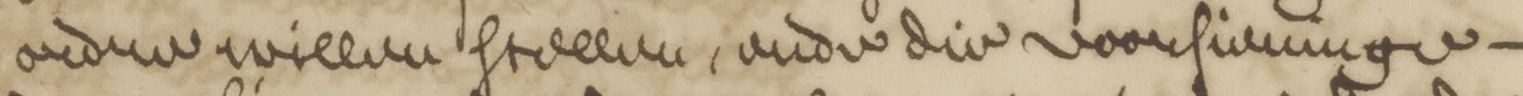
ordre willen stellen, ende die voorsieninge
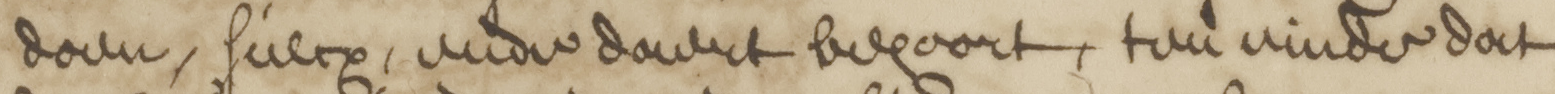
doen, sulcx, ende daert behoort, ten einde dat
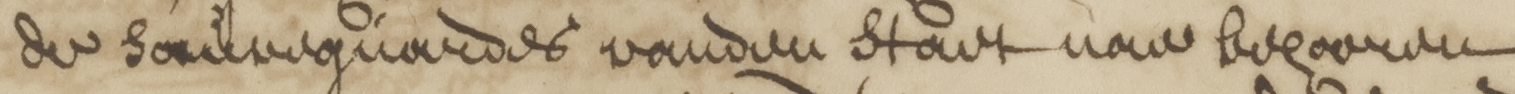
de sauveguardes vanden Staet nae behooren
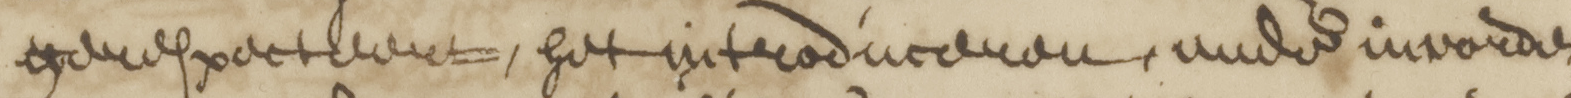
gerespecteert, het introduceren, ende invorde,,
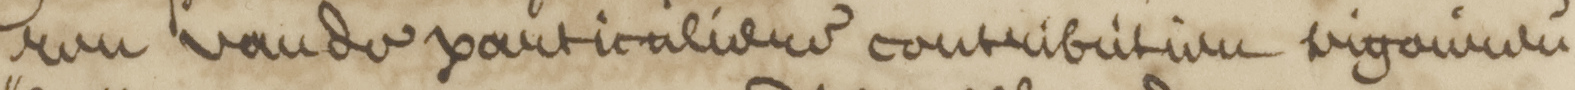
,,ren vande particuliere contributien vigouren,,
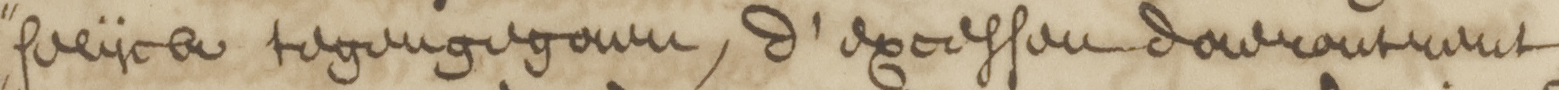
,,selijck tegengegaen, d'excessen daerontrent
